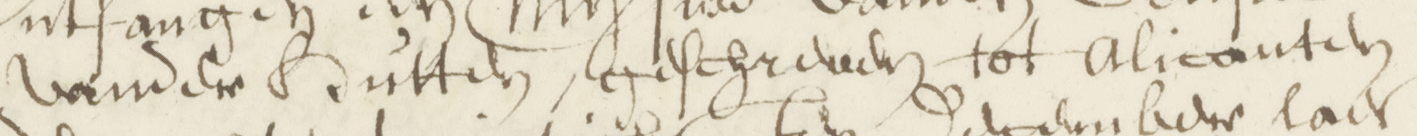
vander Hutten, geschreven tot Alicanten
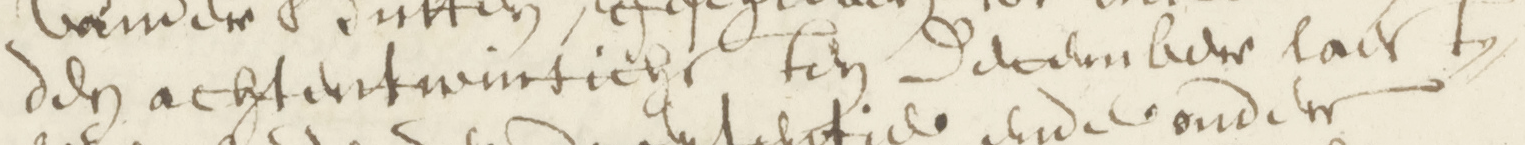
den achtentwintichsten December laest„
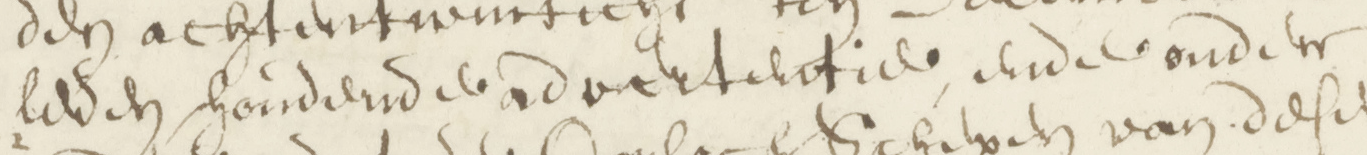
leden, houdende advertentie, ende onder
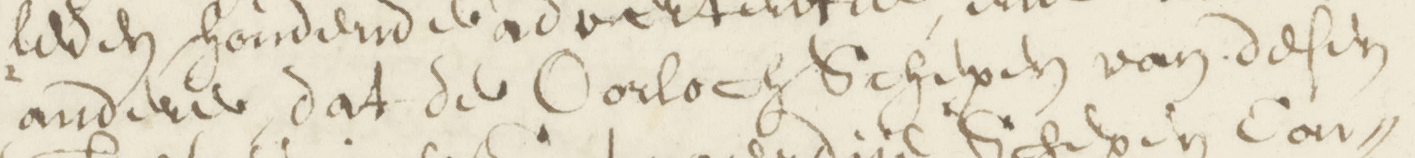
andere dat de OorlochSchepen van desen
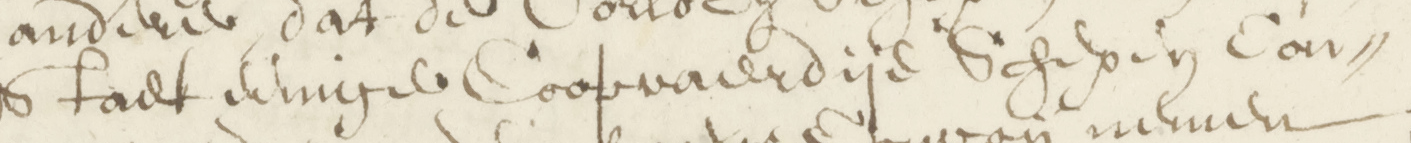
Staet eenige Coopvaerdije Schepen Con„
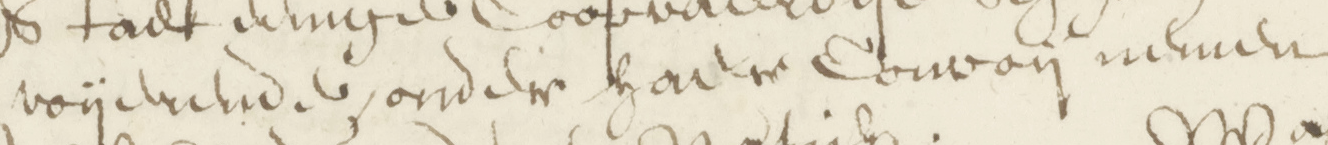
voijerende, onder haer Convoij nemen
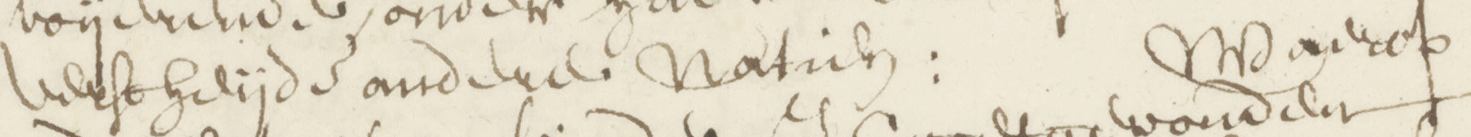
verscheijde andere Natien: Waerop
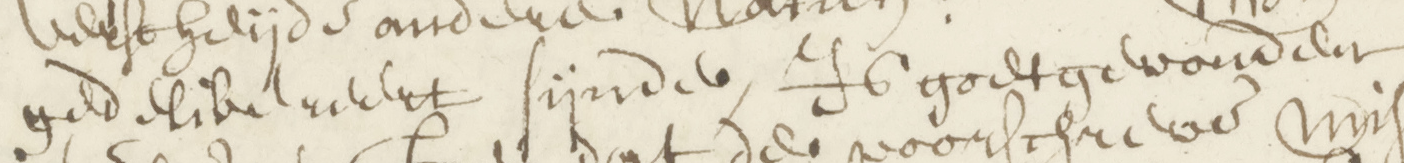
gedelibereert sijnde, Is goetgevonden
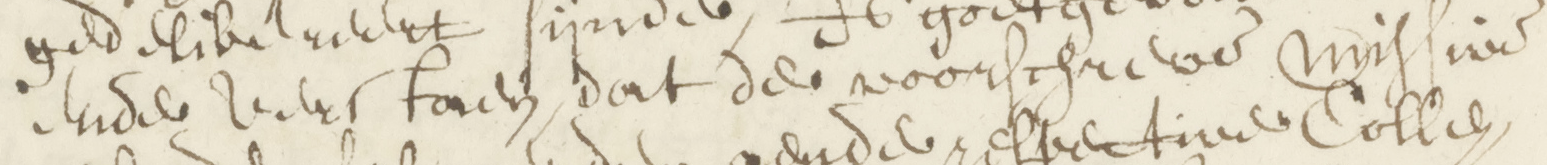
ende verstaen, dat de voorschreve Missive
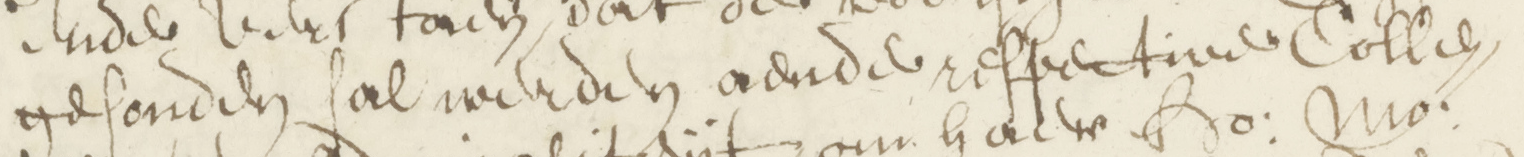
gesonden sal werden aende respective Colle,,
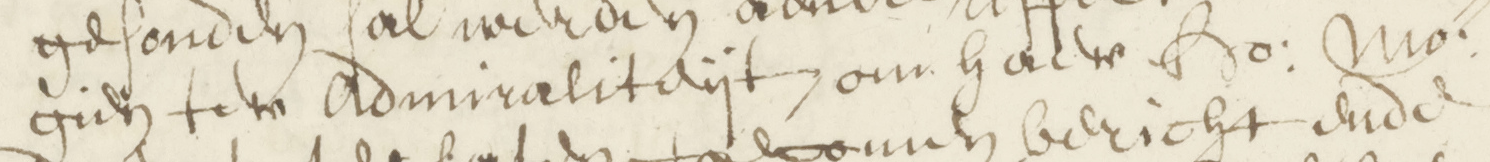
gien ter Admiraliteijt, om haer Ho:Mo:
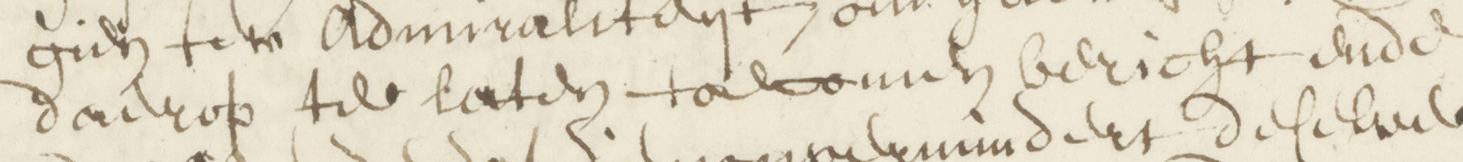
daerop te laten toecomen bericht ende
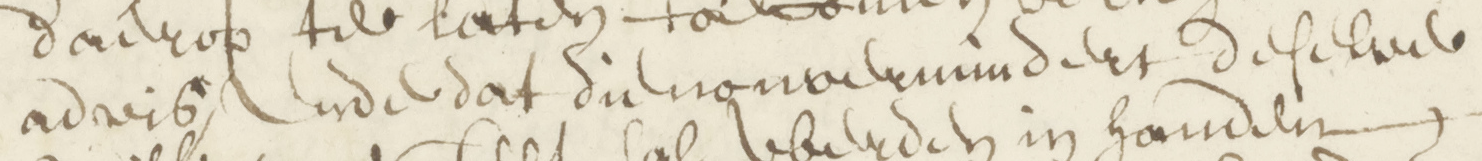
advis. Ende dat dien onvermindert deselve
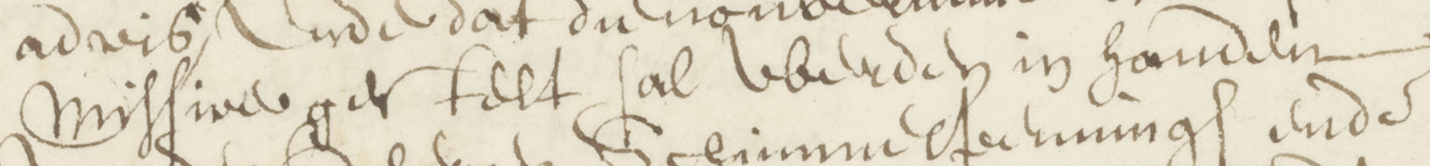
Missive gestelt sal werden in handen
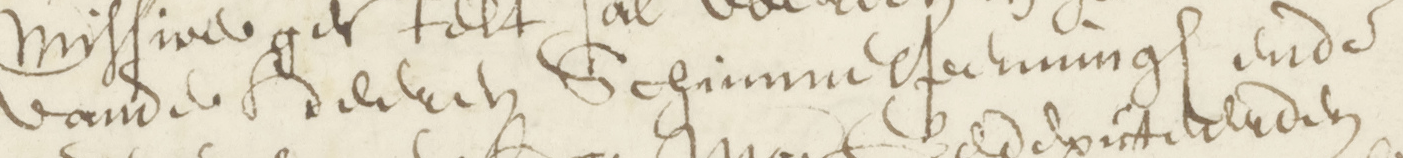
vande Heeren Schimmelpenningh ende
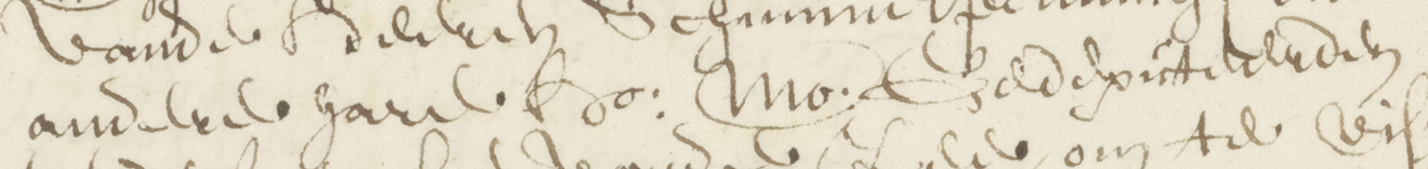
andere hare Ho:Mo: Gedeputeerden
